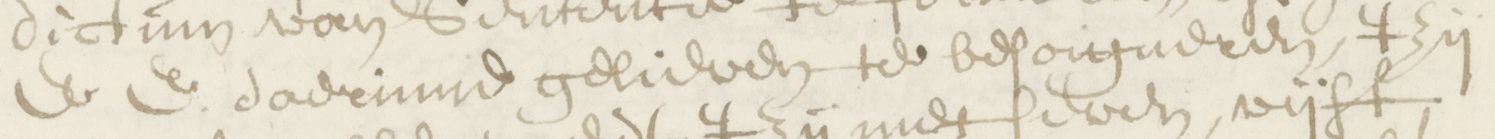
E. E. daerinne gelieven te besoigneren, 't zij
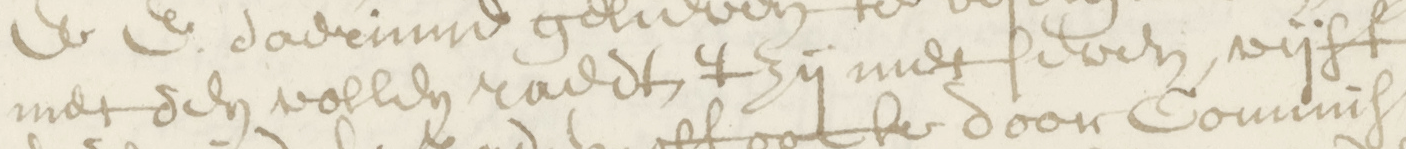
met den vollen raedt, 't zij met seven, vijff
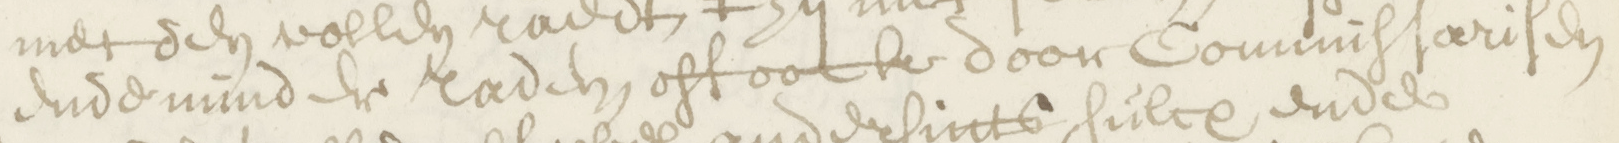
ende minder raden, oft oock door Commissarisen
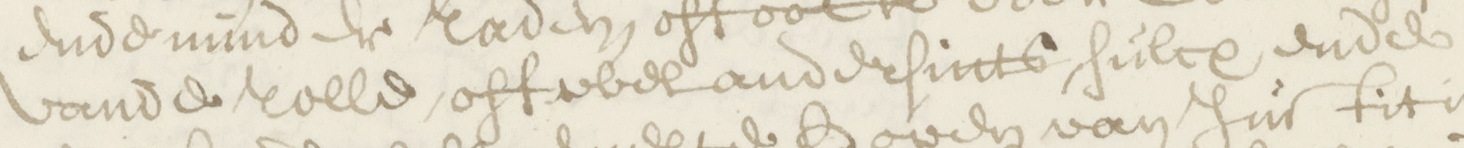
vande rolle, oftwel andersints, sulcx, ende
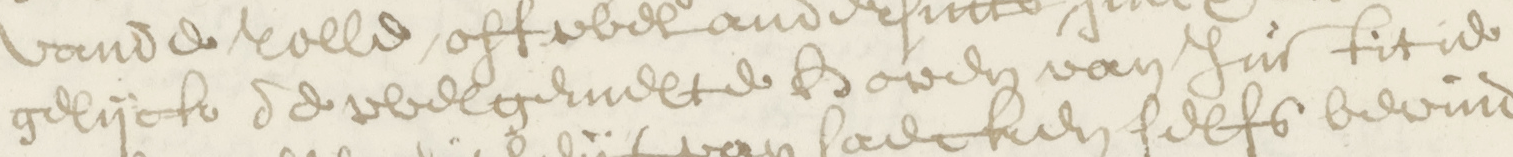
gelijck de welgemelte Hoven van Justitie
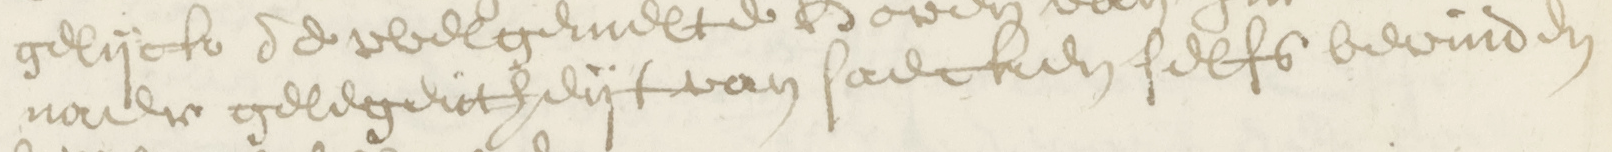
naer gelegentheijt van saecken selfs bevinden
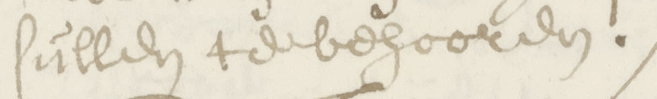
sullen te behooren.
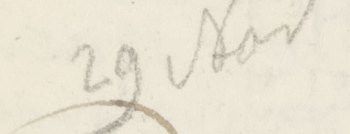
29 Nov.
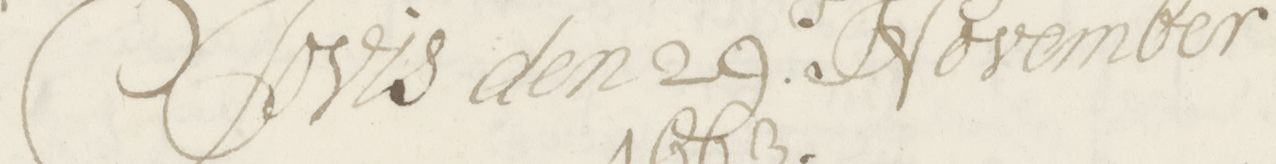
Jovis den 29en November.
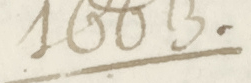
1663.
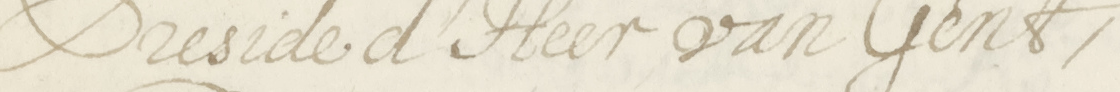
Preside d'Heer van Gent,
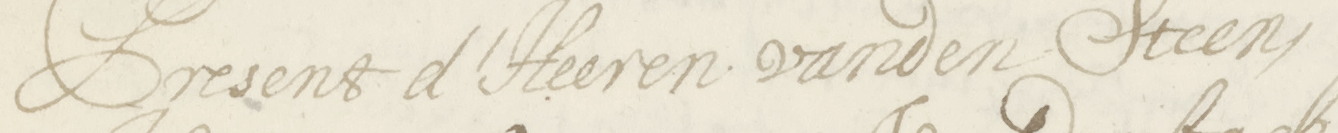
Present d'Heeren vanden Steen,
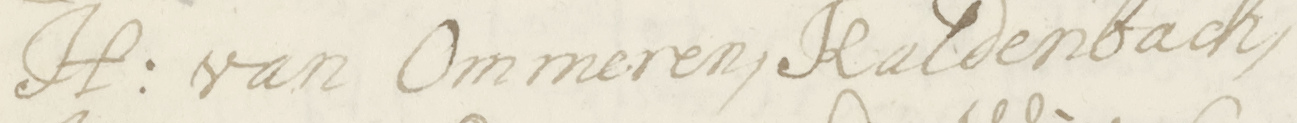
H: van Ommeren, Kaldenbach,
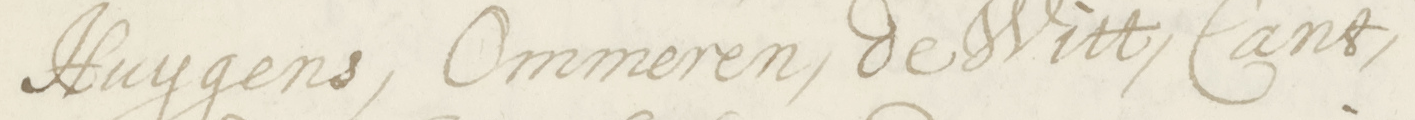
Huygens, Ommeren, de Witt, Cant,
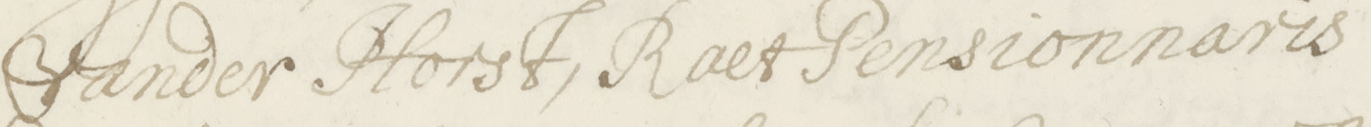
vander Horst, Raet Pensionnaris
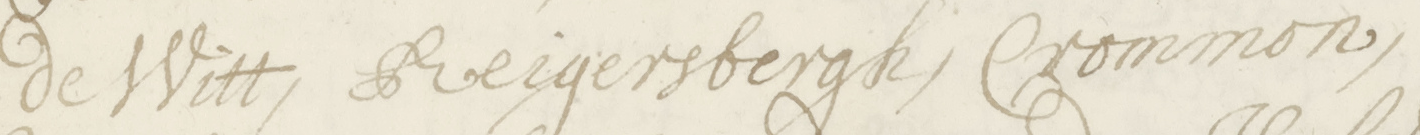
de Witt, Reigersbergh, Crommon,
